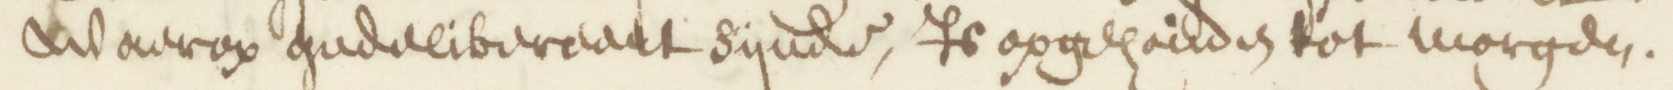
Waerop gedelibereert sijnde, Is opgehouden tot morgen.
